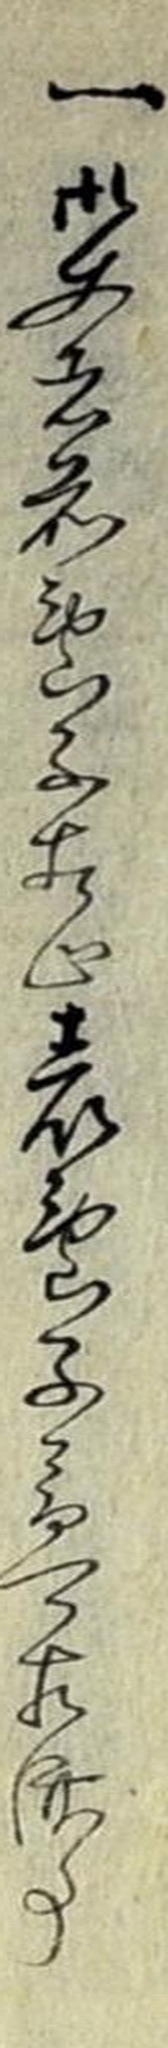一御使者前台子相止表台子に而可相済事
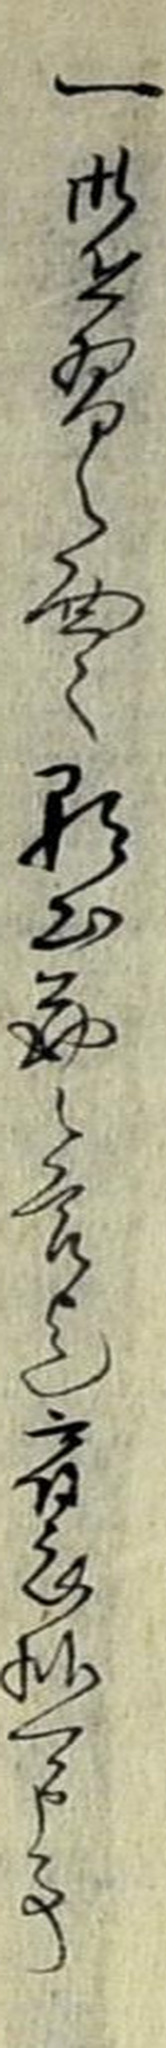一御近習之面々願出勤之節迄肩衣掛可申事
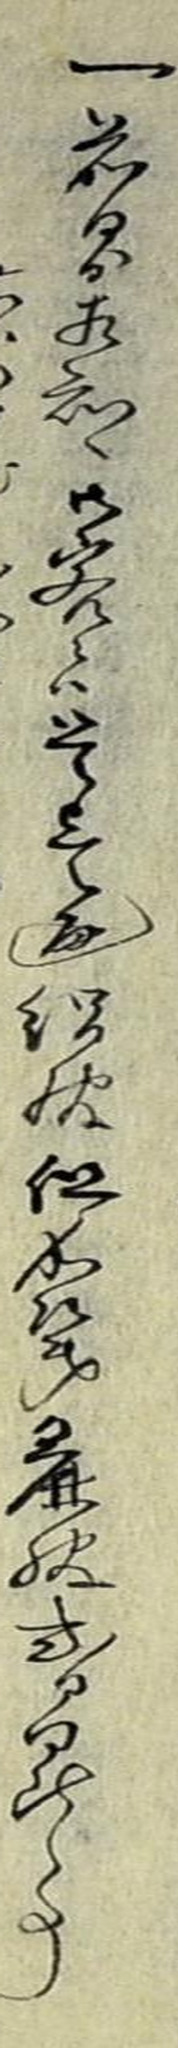一前日ゟ相知候御客には是迄之通絹服但成次第麁服式日同断之事
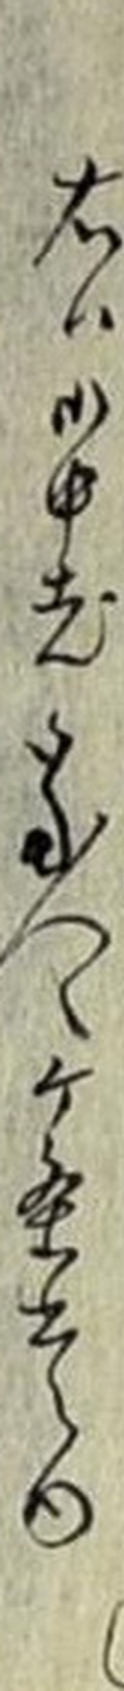右は御中老御用人へケ条書之内
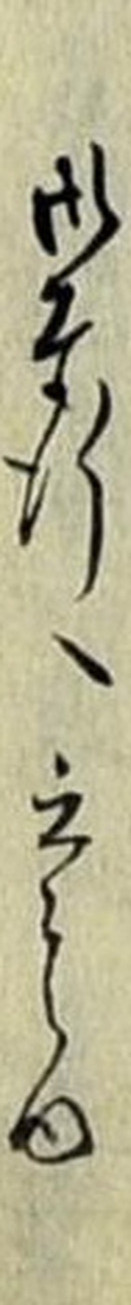御奉行へ云々之内
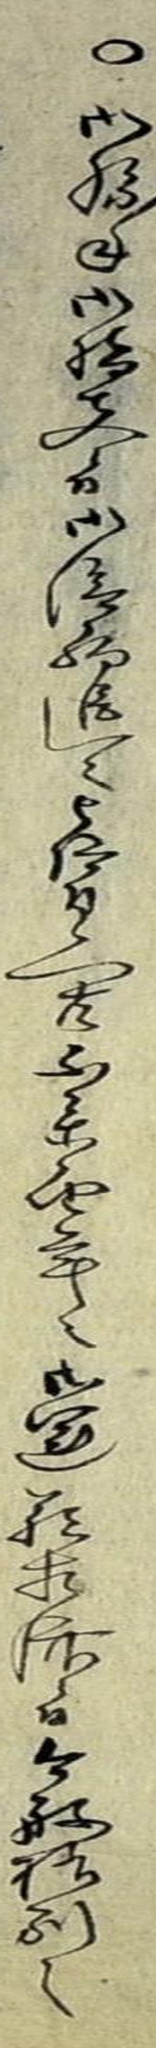〇御勝手御指支に付御倹約追々被仰付候へ共不参届年々御運難相済に付今般格別之
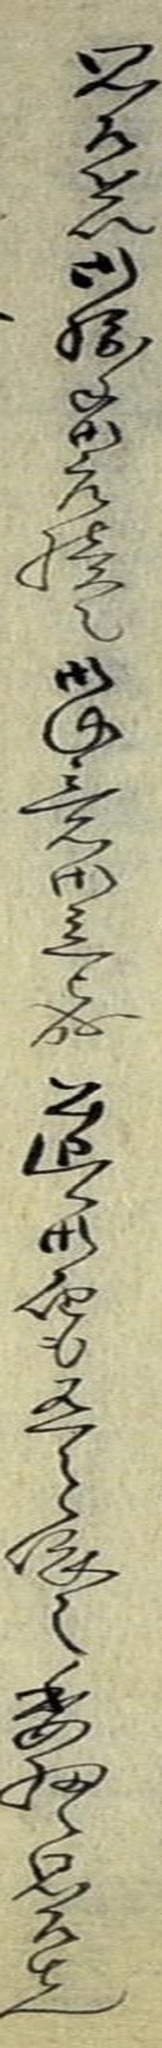思召を以御勝手御取続之御趣意御立被成公辺へ御届も有之候依之委細之思召先
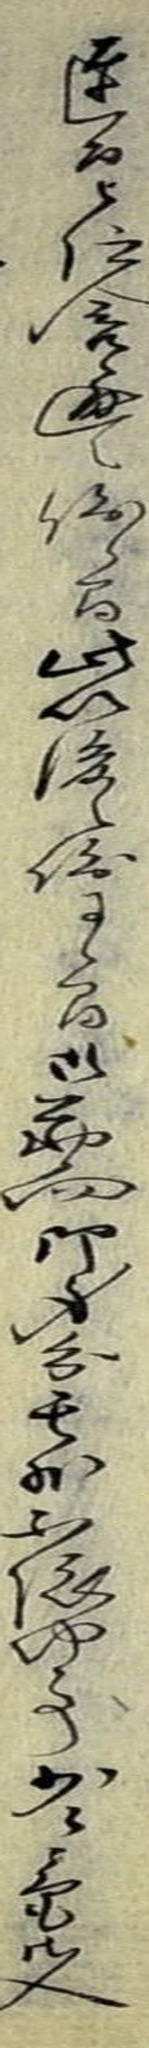達而被仰含候通之儀候間此以後之儀に候間御勤向御身分其外不依何事少々に而も御入
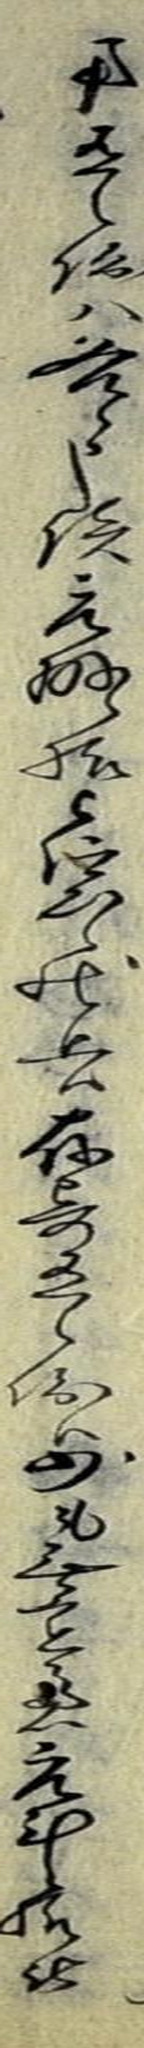用有之儀は各々申談取扱候様被仰出候然上は存寄有之儀は少も無遠慮取斗候様被
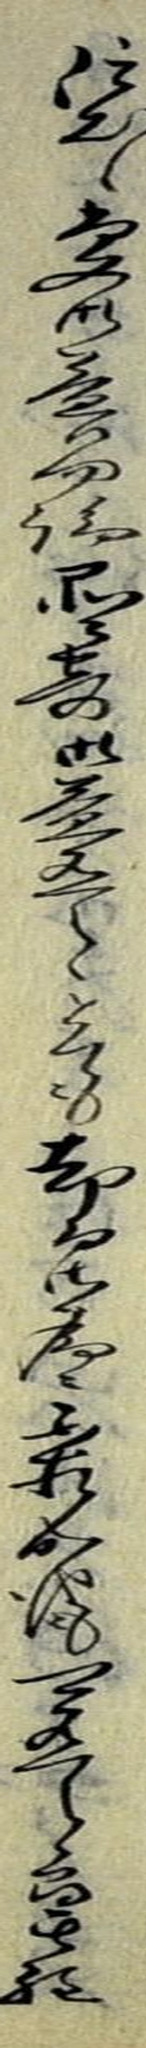仰出候尚又御益は勿論品に寄御益有之候とても却而御為に不相成儀も可有之候間其程
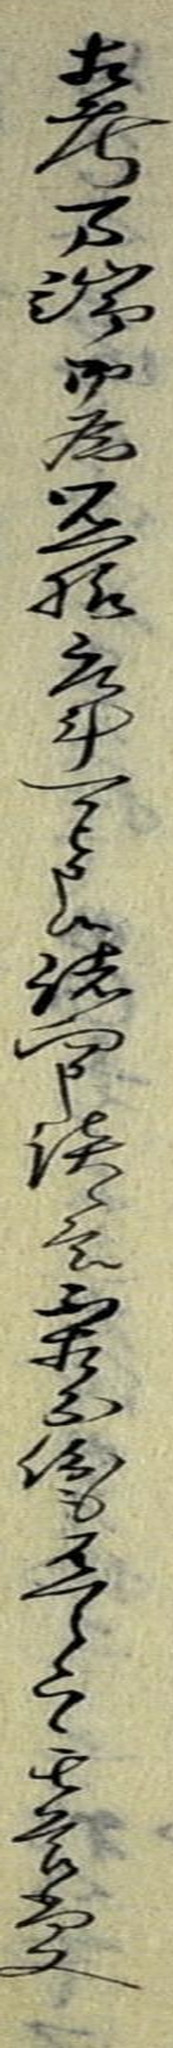相考万端御為宜様取斗可被申候諸向申談候節不相分儀も有之候はゝ其節尚又
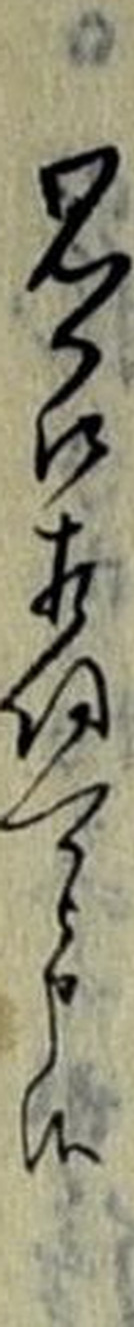思召相伺可被申候
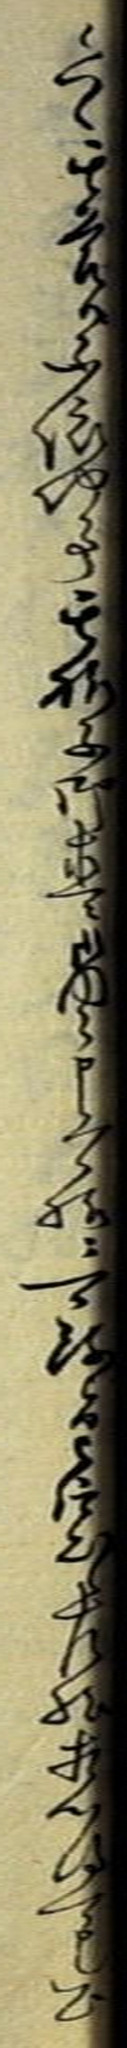候はゝ其節は不依何事其様子御直に御内々申上候様に可致旨被仰出候左様相心得可申候以上
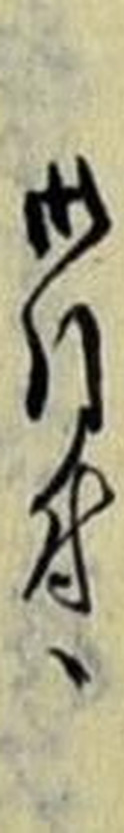御目付へ
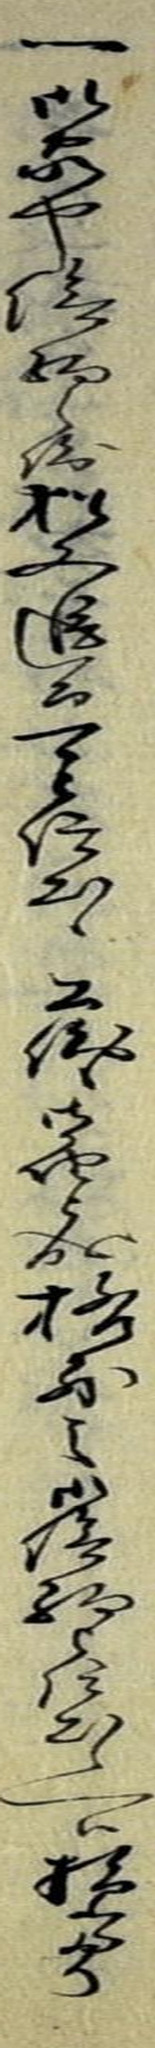一御家中倹約之儀猶又追而可被仰出候公儀へ御届被成格別之御倹約被仰出候へは指当り
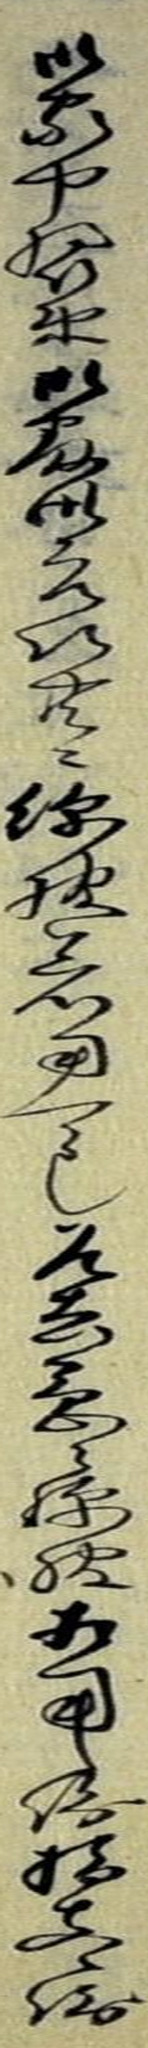御家中装束御番御取次共に綿服着用可申候乍去急に綿服相用之儀指支候儀
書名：命令之部 二
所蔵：福井県文書館 Fukui Prefectural Archives
